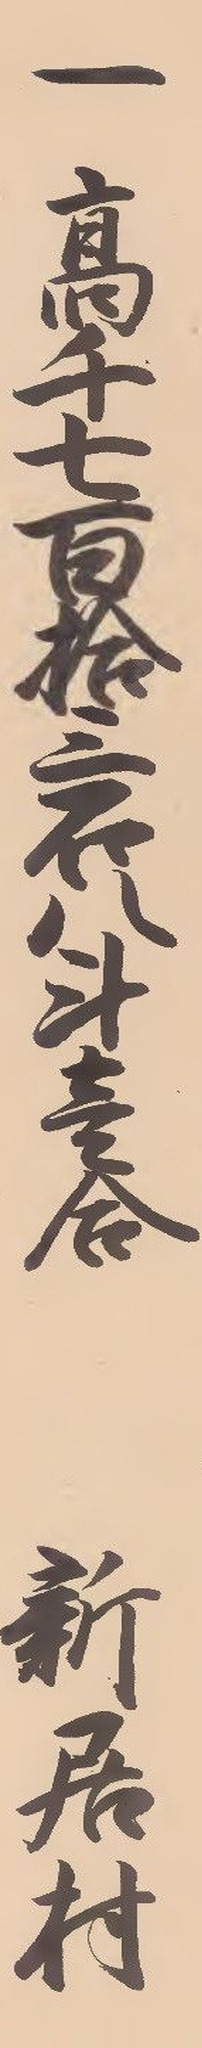一高千七百拾三石八斗壱合新居村
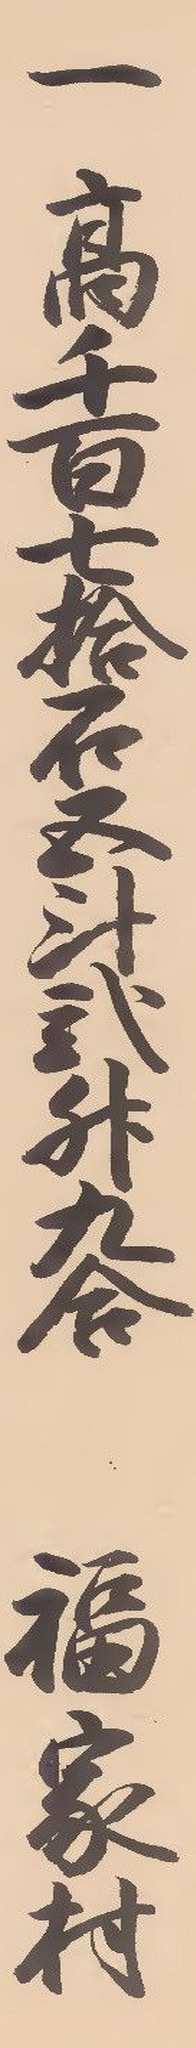一高千百七拾石五斗弐升九合福家村
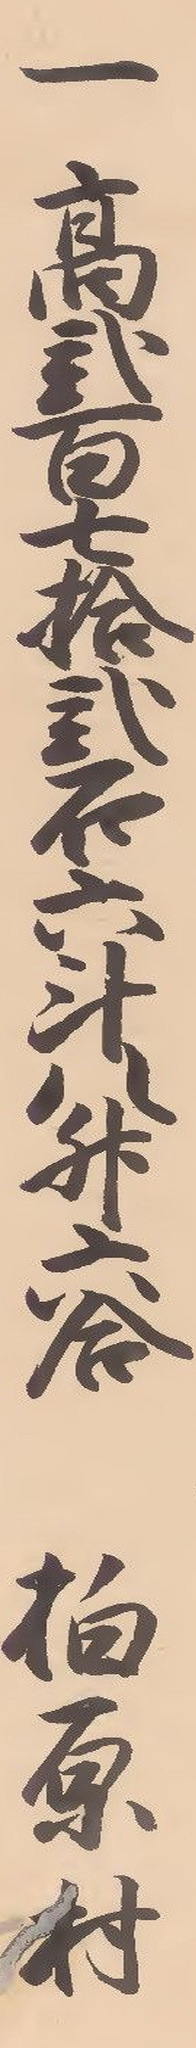一高弐百七拾弐石六斗八升六合柏原村

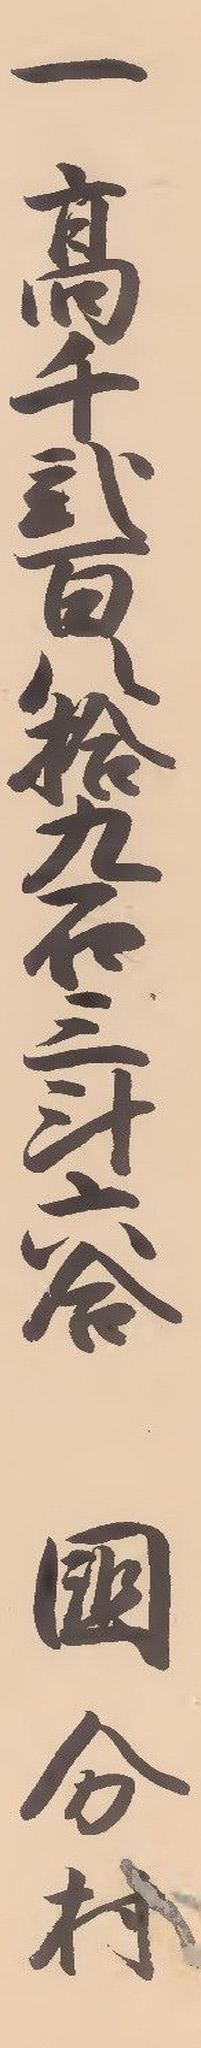一高千弐百八拾九石三斗六合国分村
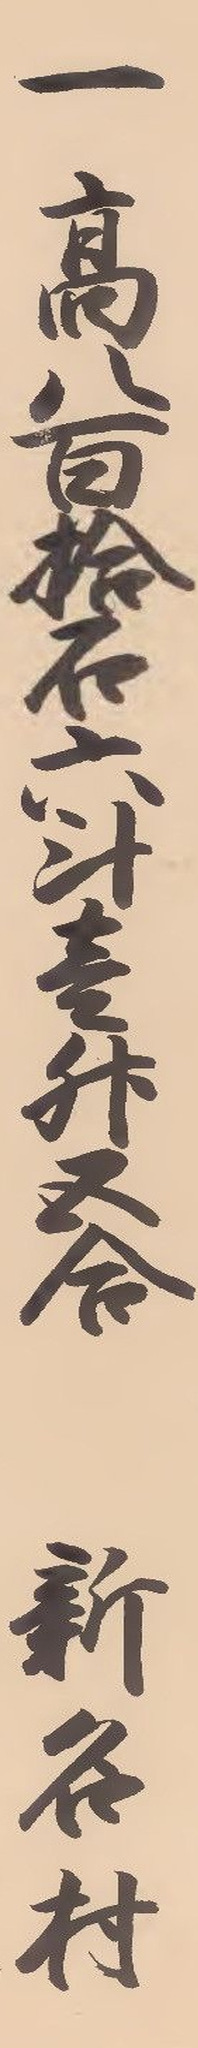一高八百拾石六斗壱升五合新名村
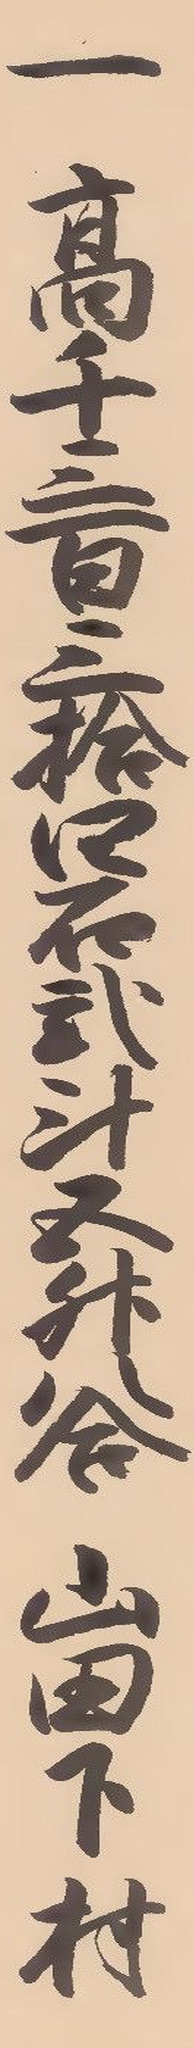一高千三百三拾四石弐斗五升八合山田下村
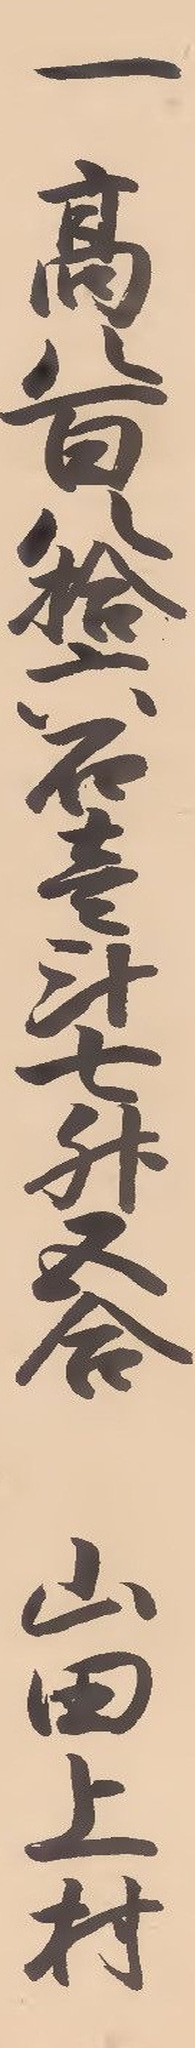一高八百八拾六石壱斗七升五合山田上村
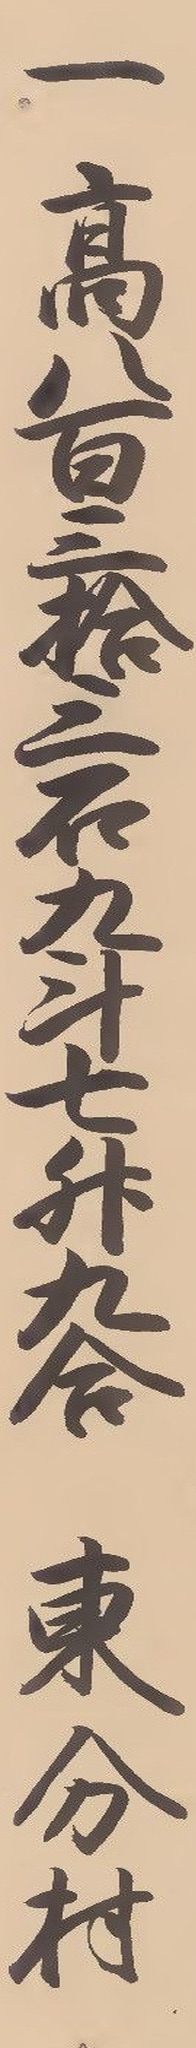一高八百三拾三石九斗七升九合東分村
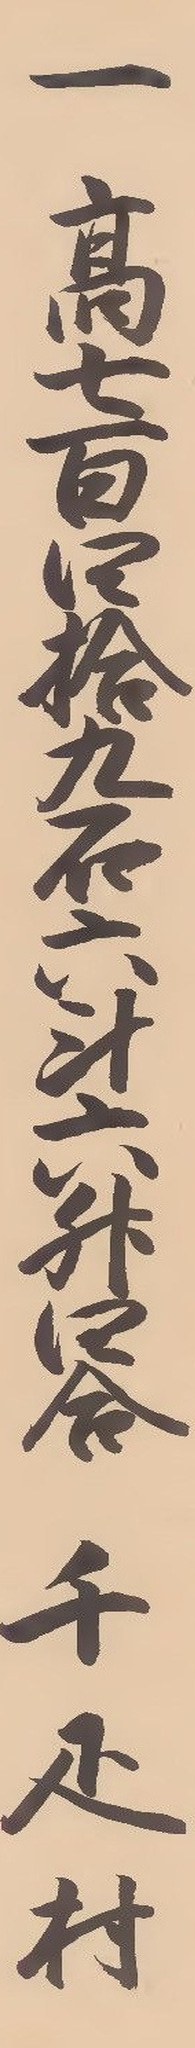一高七百四拾九石六斗六升四合千疋村

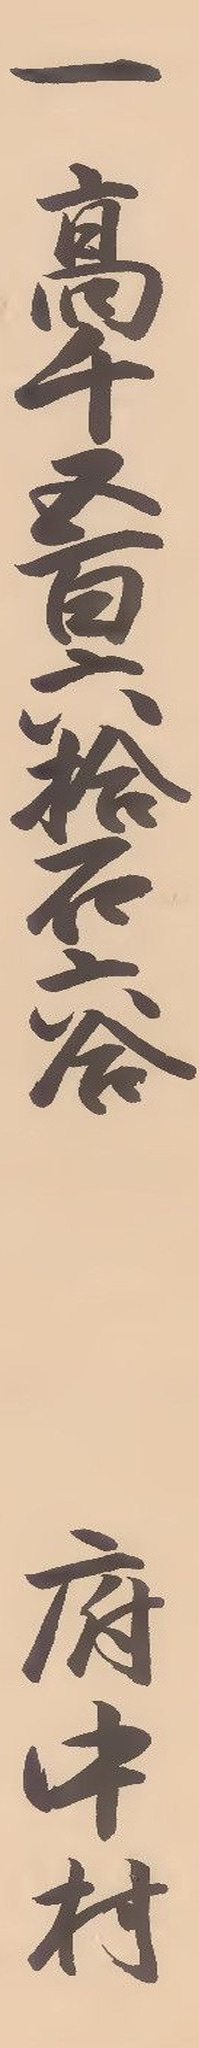一高千五百六拾石六合府中村
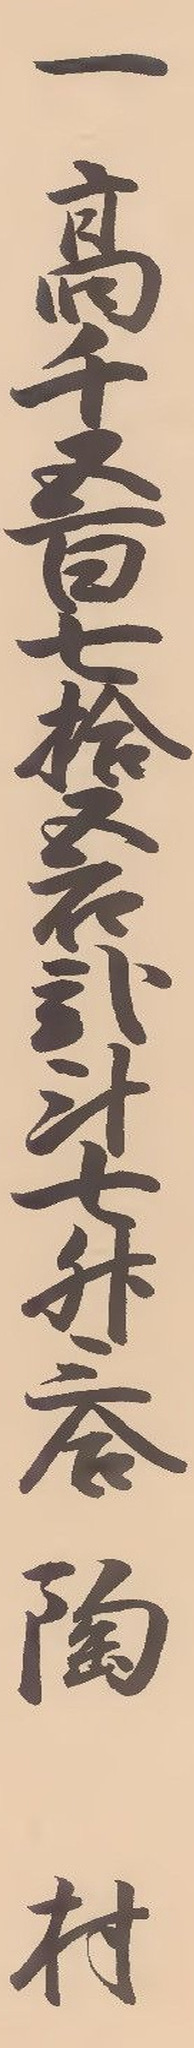一高千五百七拾五石弐斗七升三合陶村
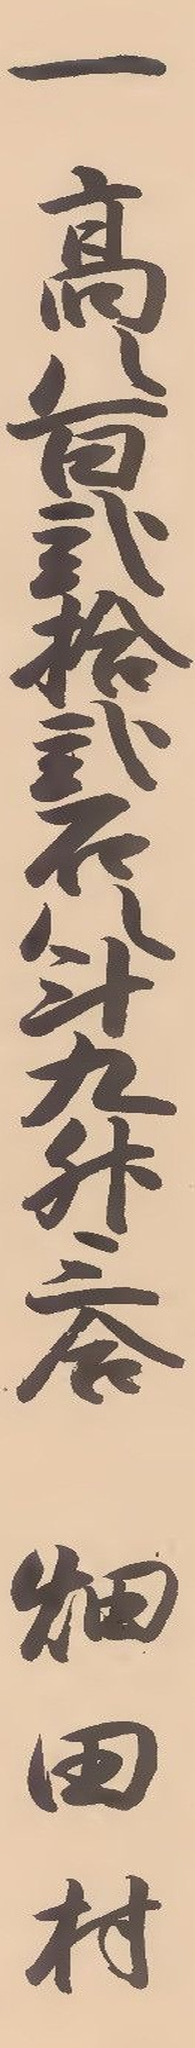一高八百弐拾弐石八斗九升三合畑田村
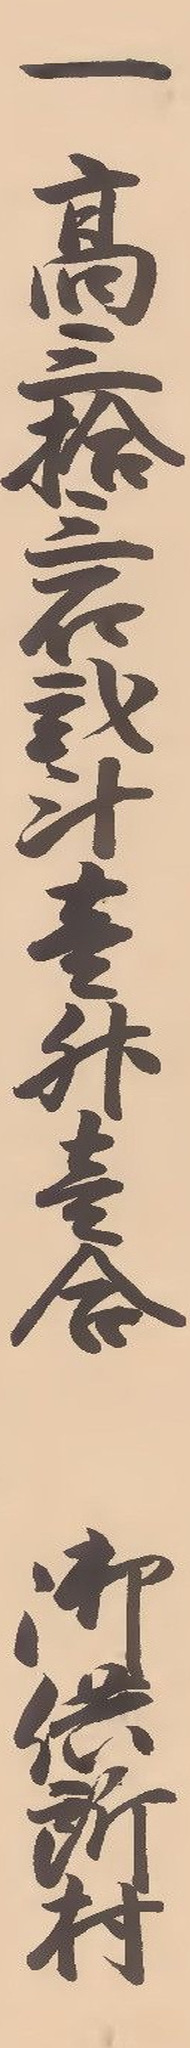一高三拾三石弐斗壱升壱合御供所村
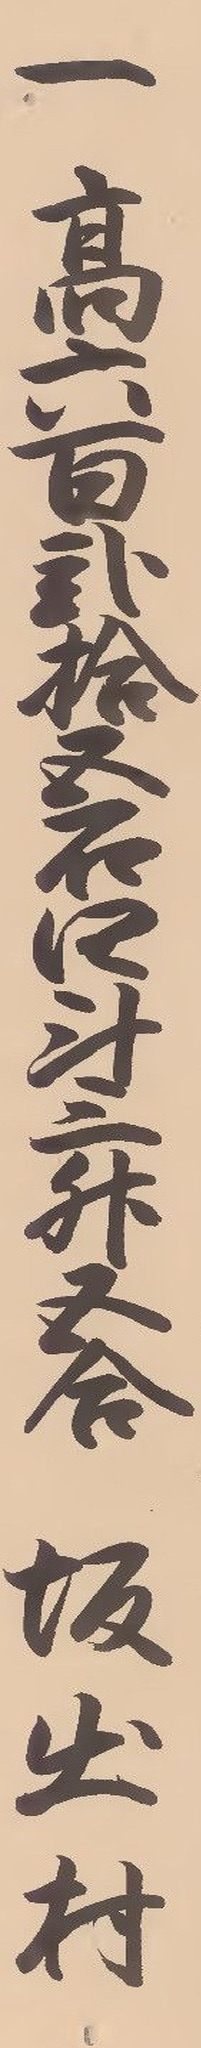一高六百弐拾五石四斗三升五合坂出村
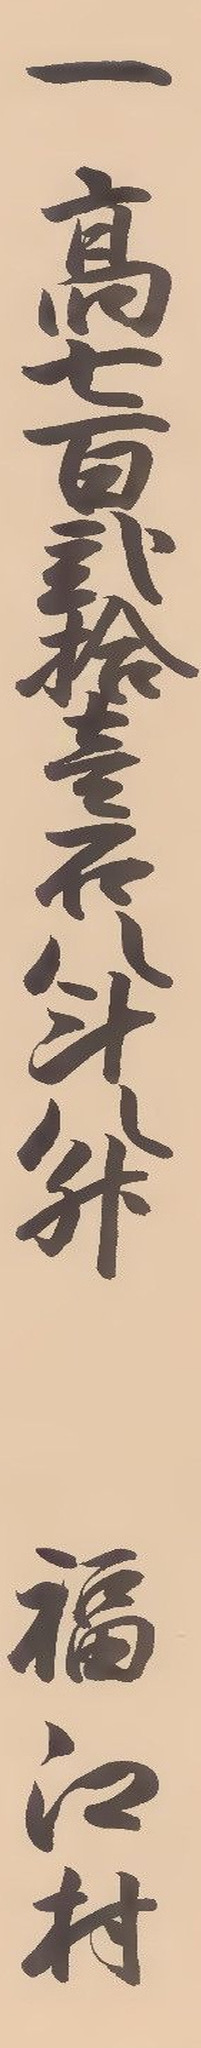一高七百弐拾壱石八斗八升福江村
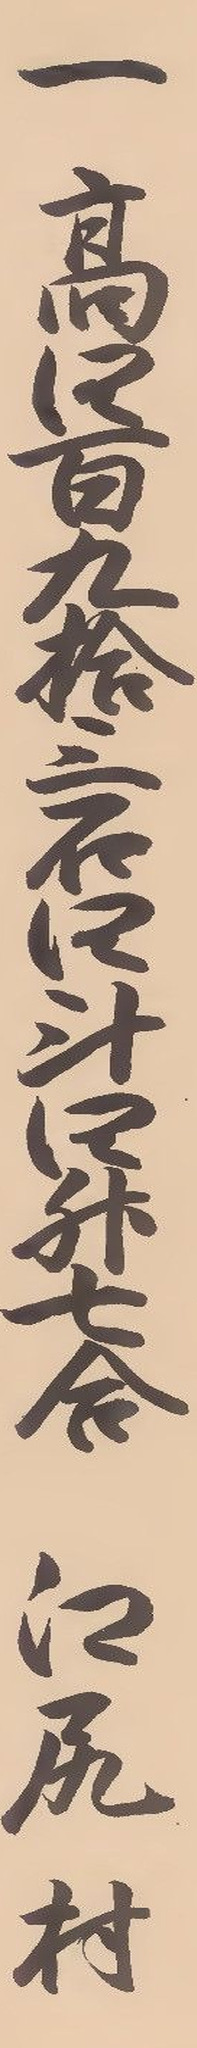一高四百九拾三石四斗四升七合江尻村
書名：讃岐国郷帳
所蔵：国立公文書館 National Archives of Japan
